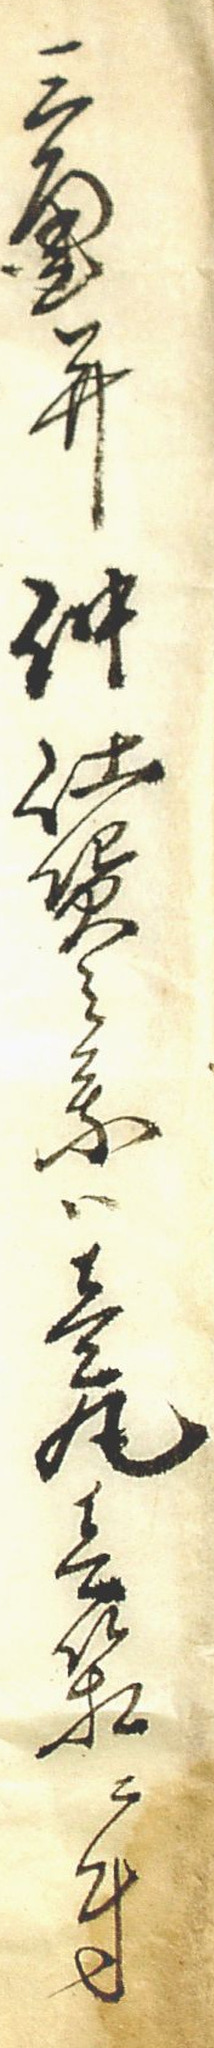三厘并仲仕賃之義は壱丸壱箱に付
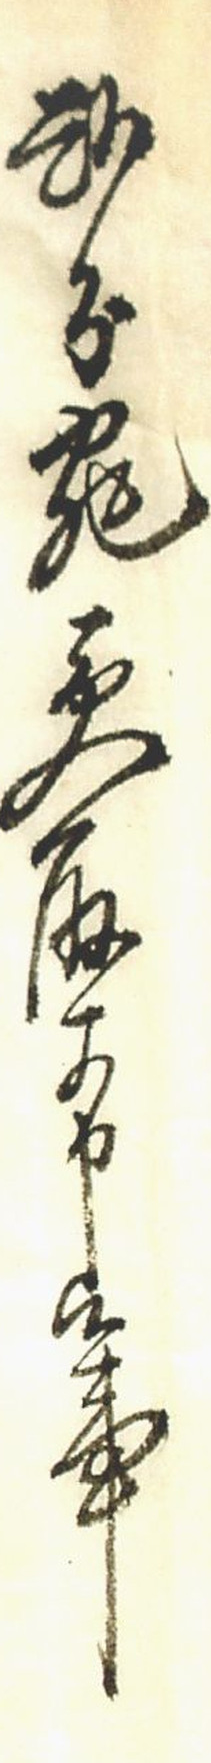弐分宛受取可申候事
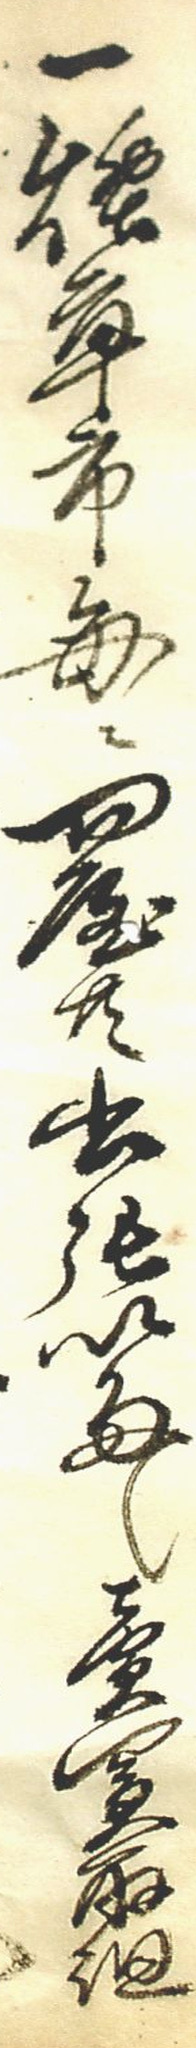一煙草市毎に問屋共出張いたし売買取組
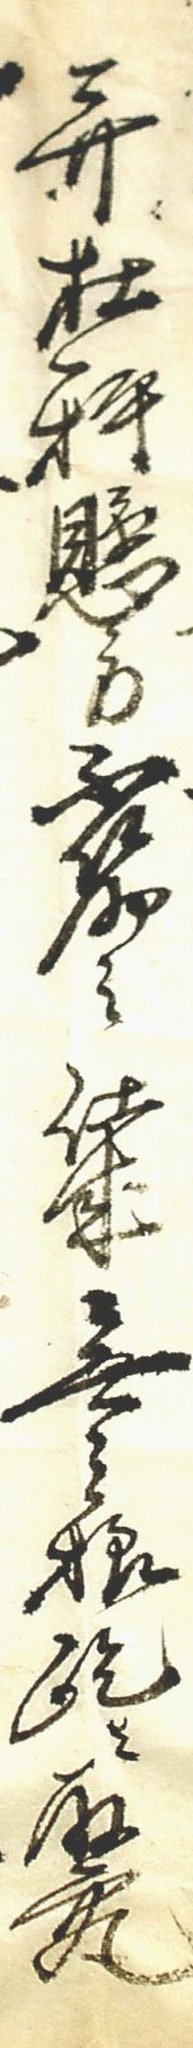并杜秤懸方不筋之仕成無之様屹と取究
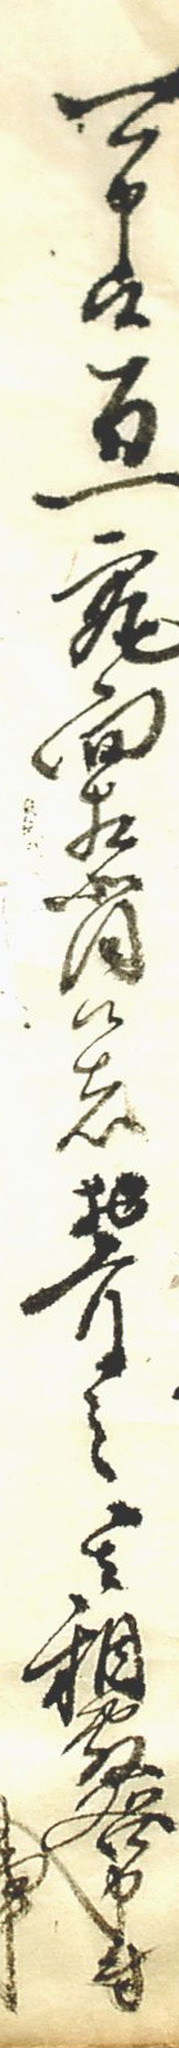可申候万一究向相背候者於有之には稠敷咎申付事
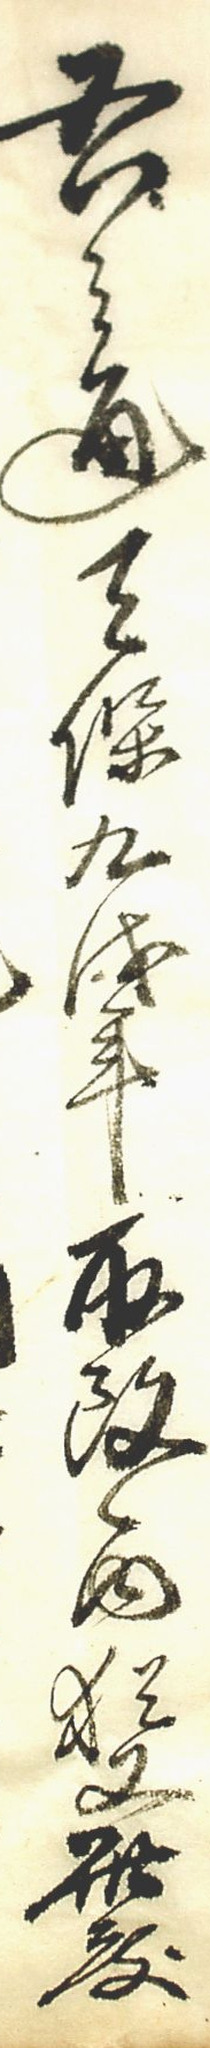右之通天保九戌年取改候内猶又此度
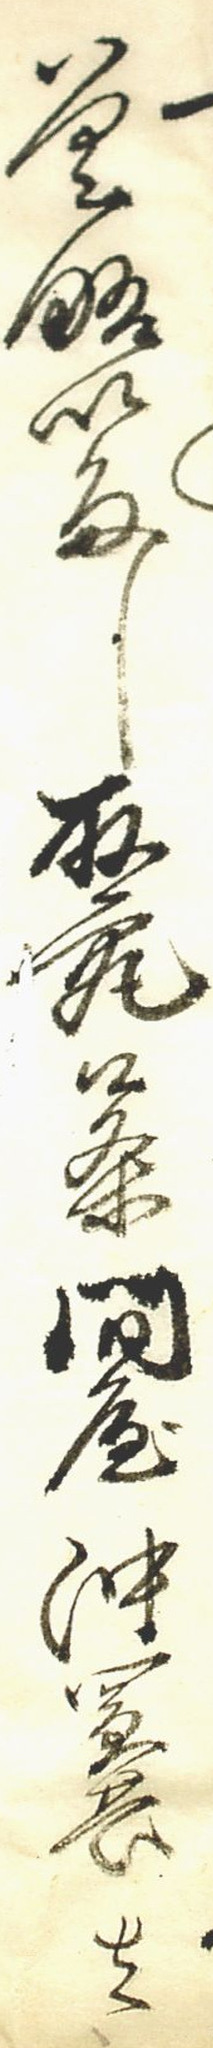差略いたし取究候条問屋仲買共は
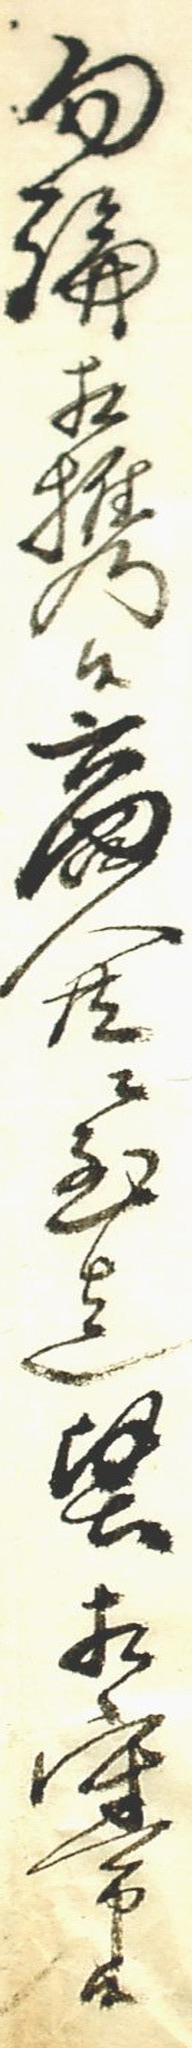勿論相携候商人共に至迄堅相守可申候
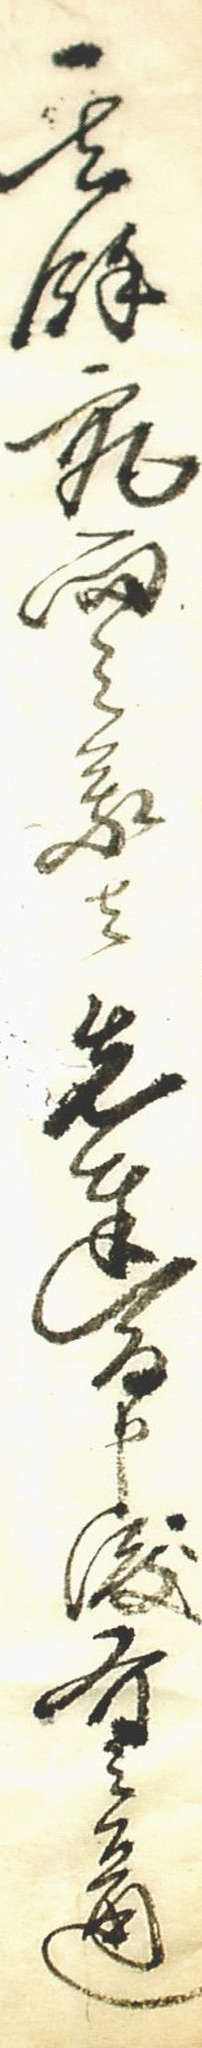其余究向之義は先達て申渡有之候通
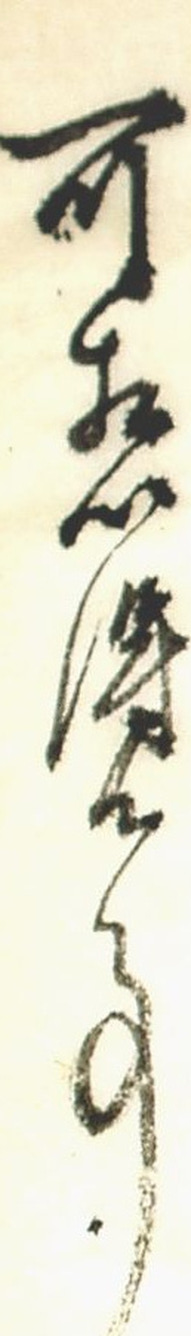可相心得候事
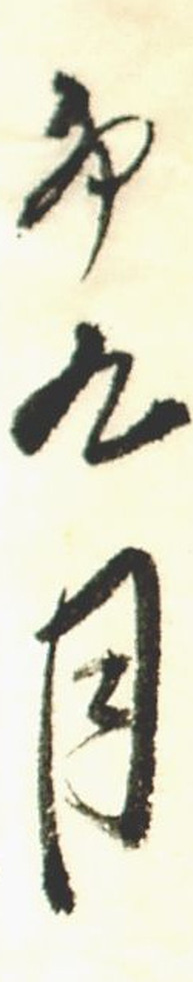卯九月
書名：煙草問屋扱方一件他
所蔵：鳴門教育大学 Naruto University of Education
